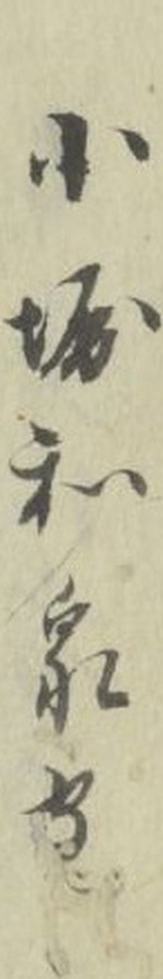小堀和泉守
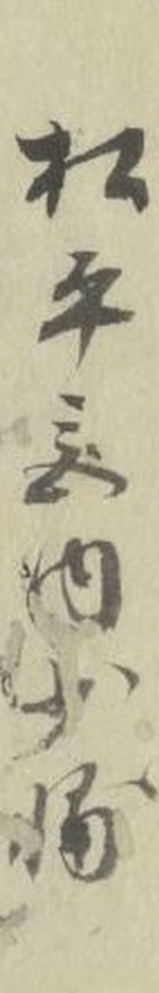松平宮内少輔
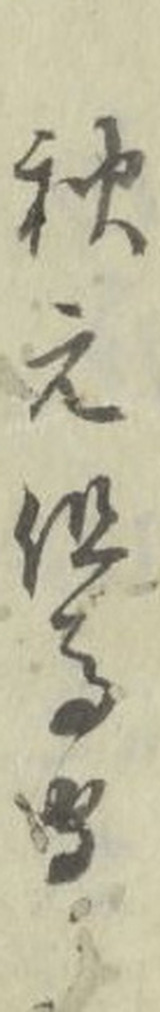秋元但馬守
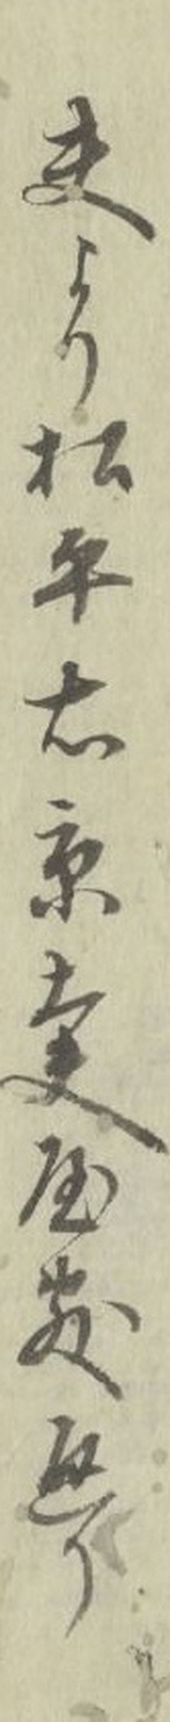夫より松平右京大夫屋敷通り
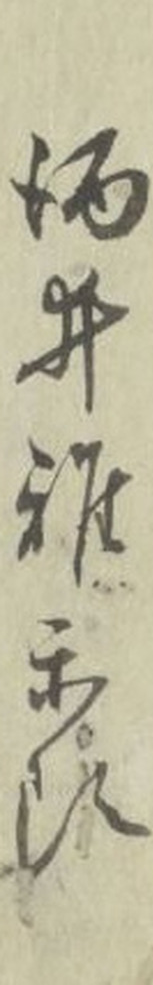酒井雅楽頭

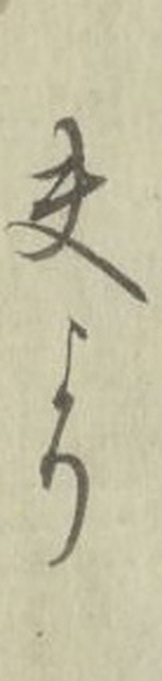夫より
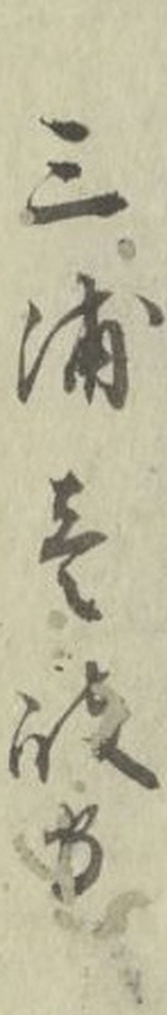三浦壱岐守
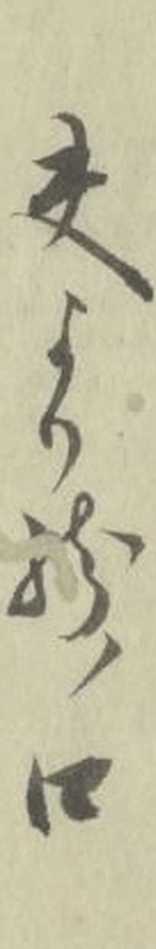夫より龍の口
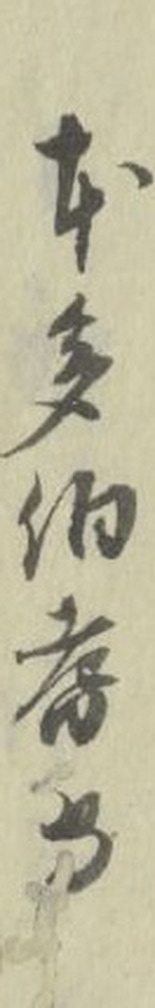本多伯耆守
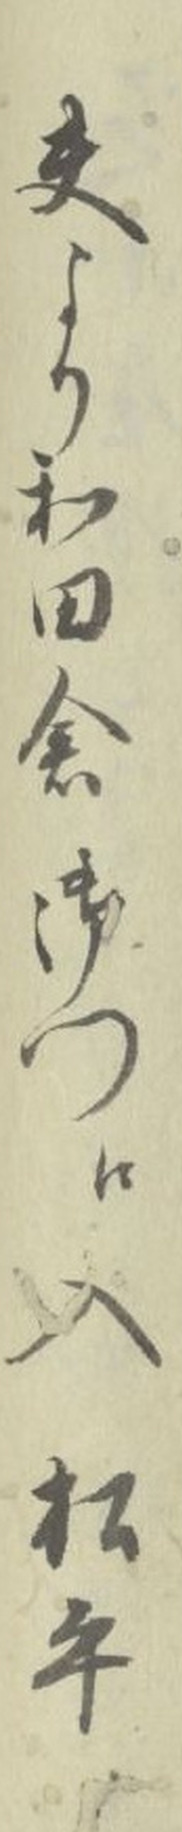夫より和田倉御門え入松平
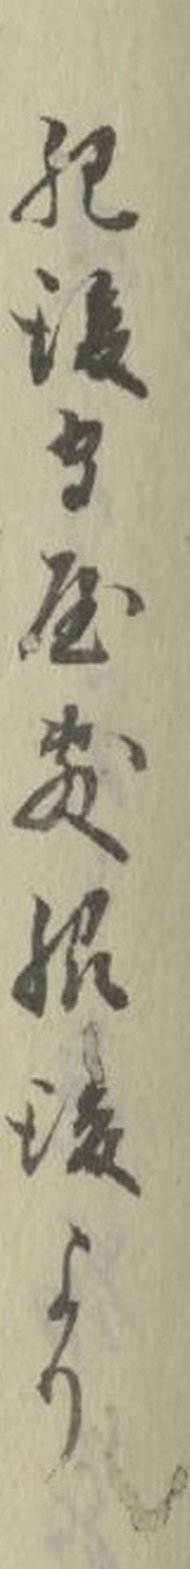肥後守屋敷脇後より
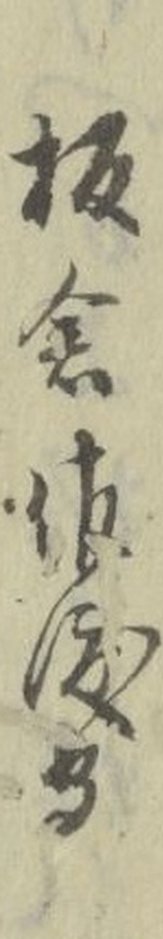板倉佐渡守
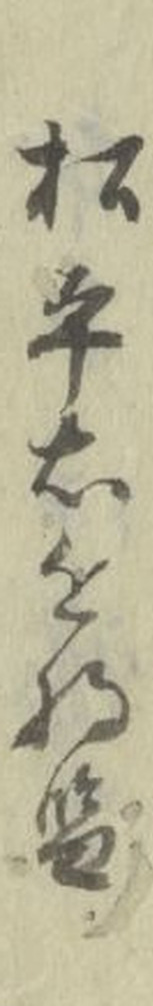松平右近将監
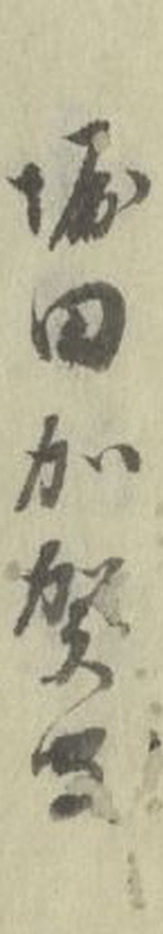堀田加賀守
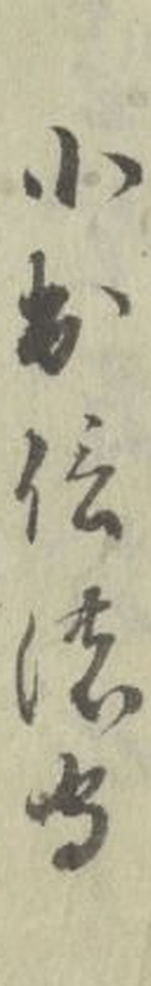小出信濃守

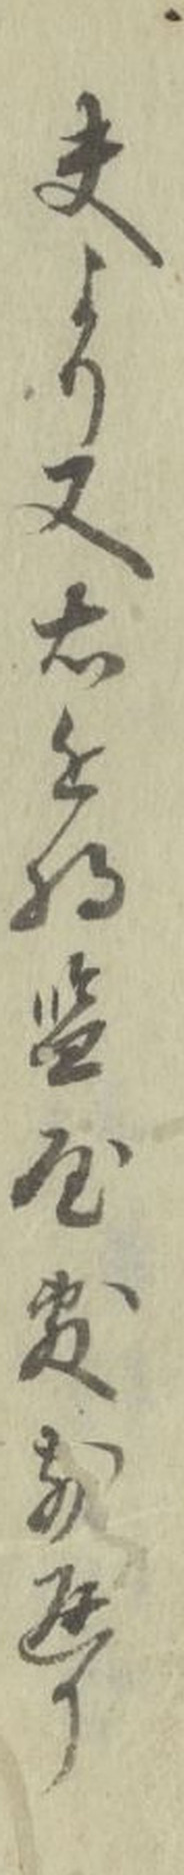夫より又右近将監屋敷前通り
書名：琉球来朝記 自一至七
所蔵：University of the Ryukyus Library
